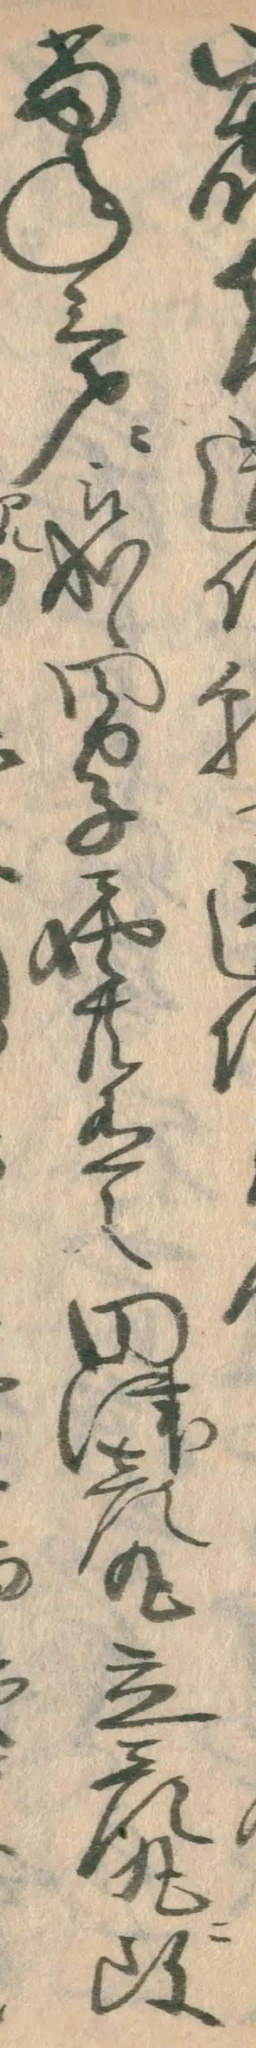当年三才ニ被成候男子届共有之田津彦丸立彦丸ニ改
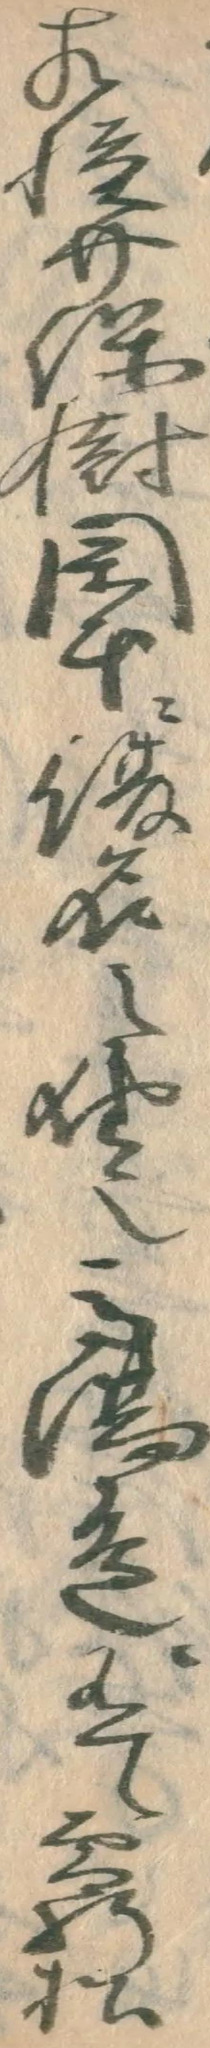相模介保樹岡本ニ復名之届也馬場辺ニ有之雪折松
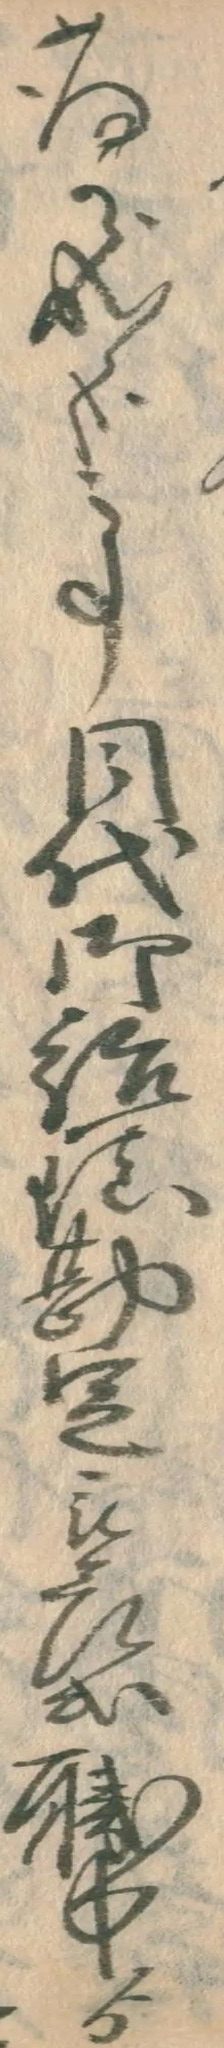如何可被成候哉之事目代御結鎮勘定被差出職中ゟ
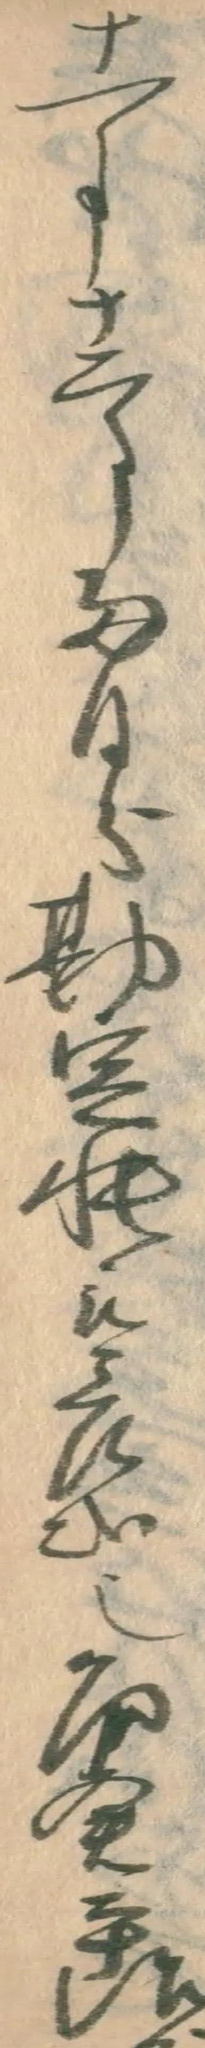十一月十二月両月分勘定帳被差出也角倉平治ゟ

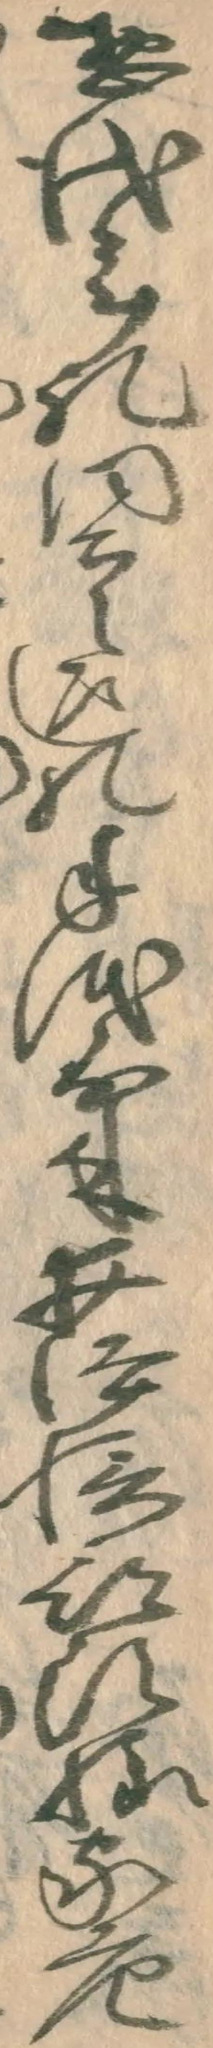惣代年礼伺公之返礼手紙到来井伊掃部頭様家老
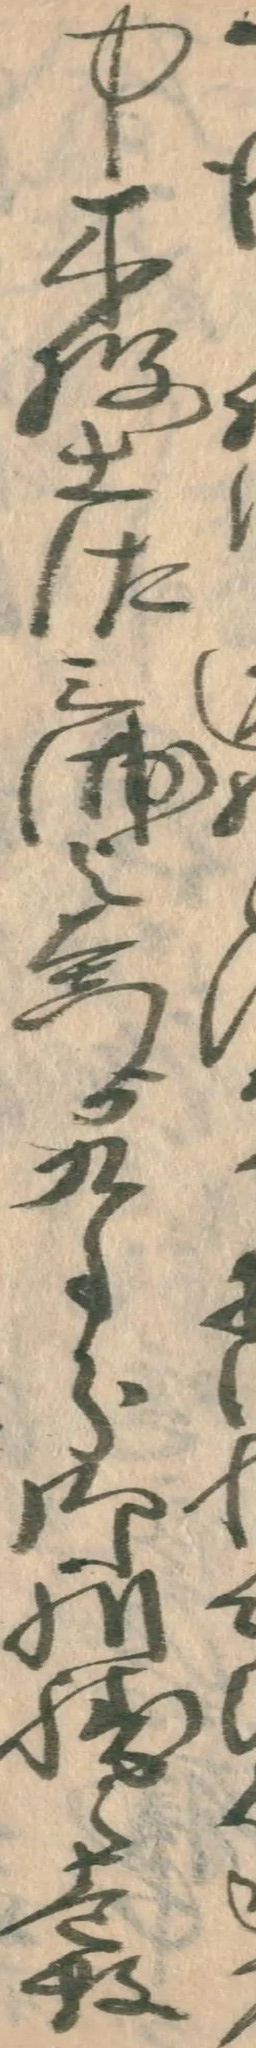中木俣土佐三浦与右衛門ゟ九月分御祈祷之巻数
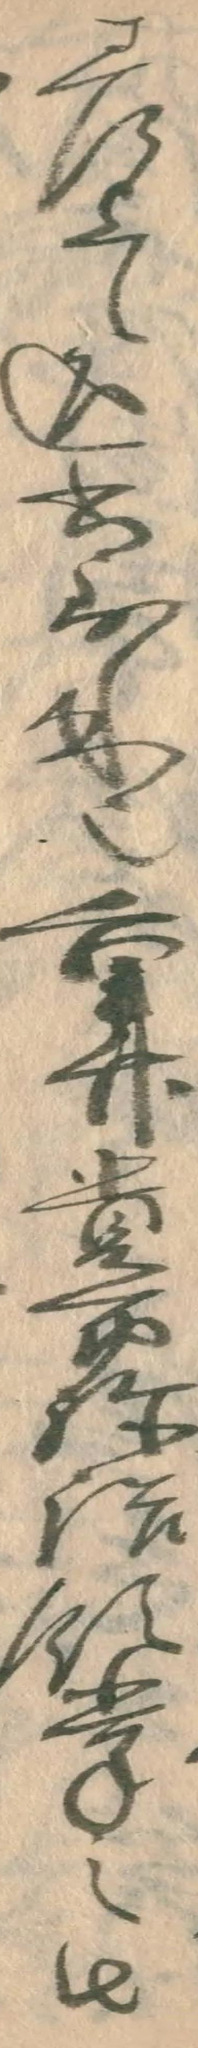差上候返書到来也重竹貴布祢詰領掌之由
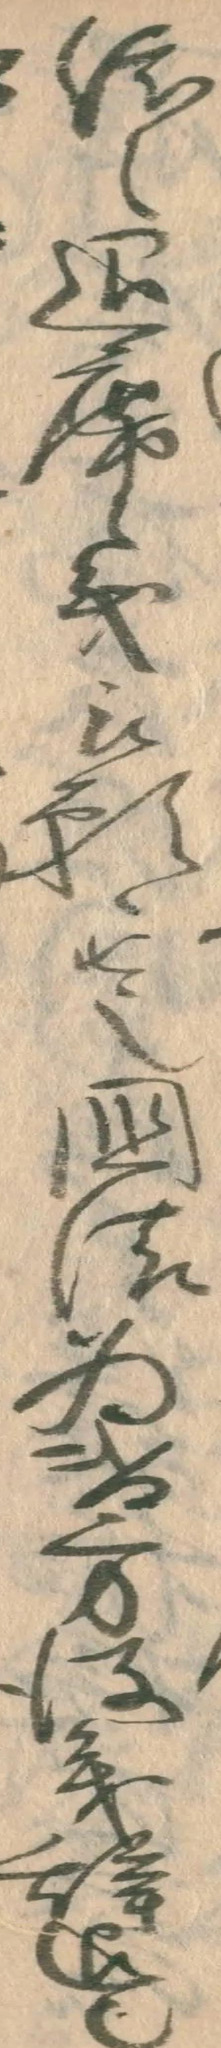依之退席之義被願候由也国清為替方役義辞退也
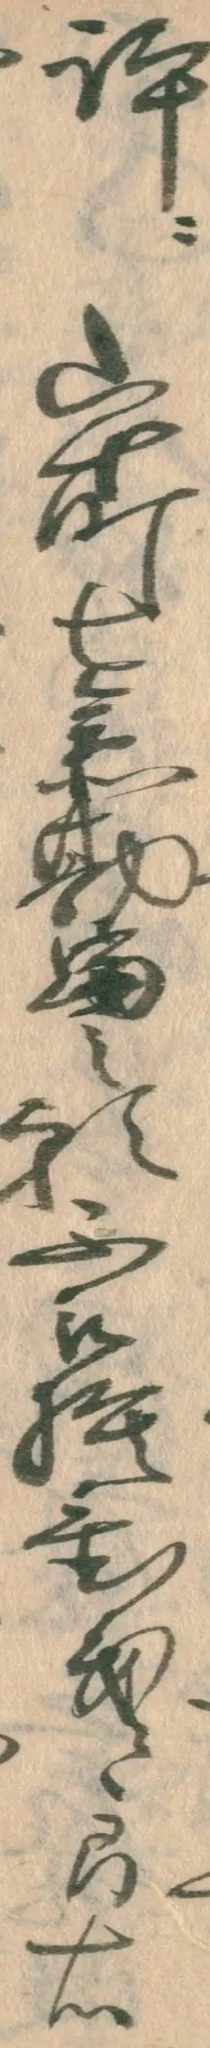評ニ山本町長兵衛勘当之願不被捨置義ニ候間右
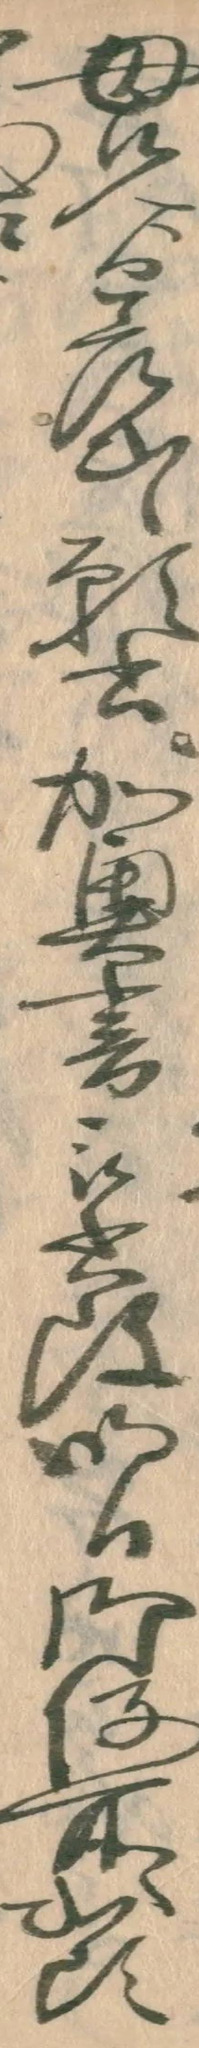母兄ゟ差出候願書ニ加奥書被書改明日御役所へ出頭
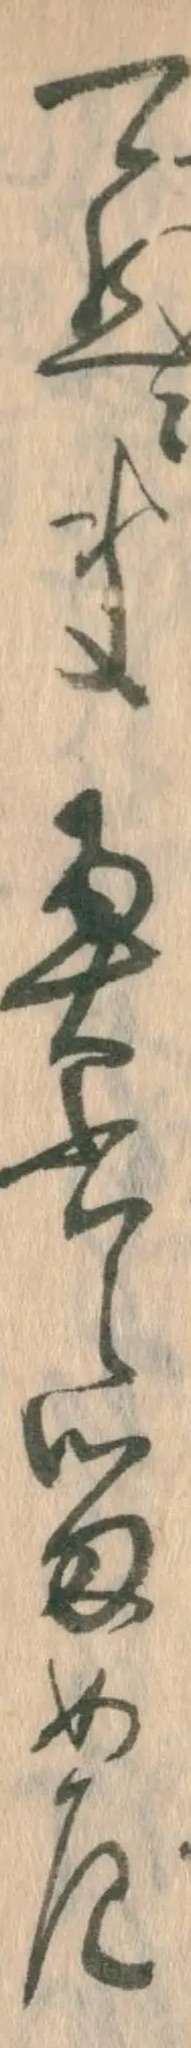可然ニ決奥書之留如左
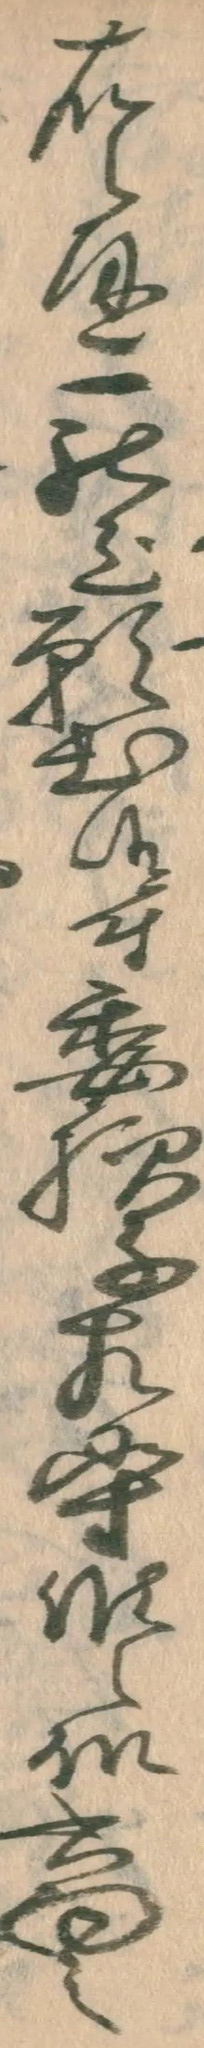右之通一社迄願出候ニ付委様子相尋候之処書面之
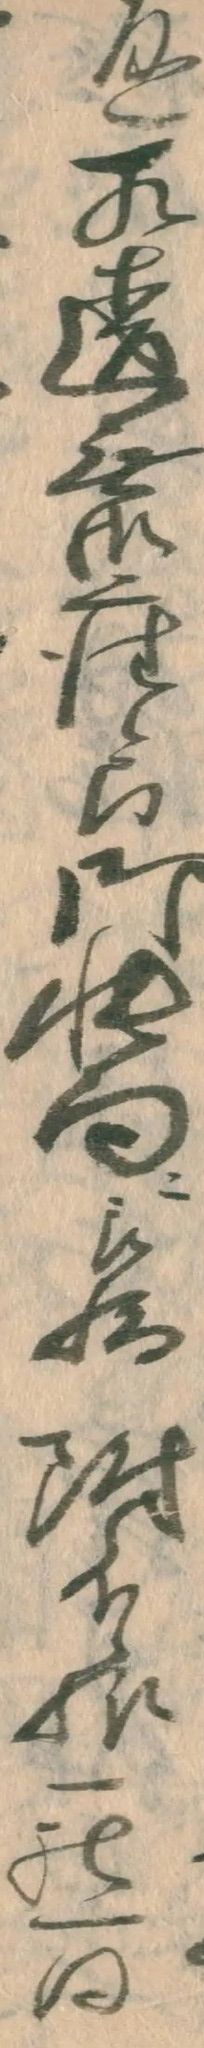通相違無御座候間御帳面ニ被為附下候様一社一同
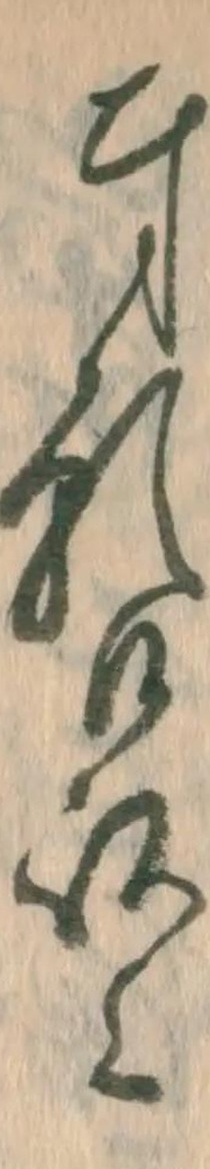奉願候以上
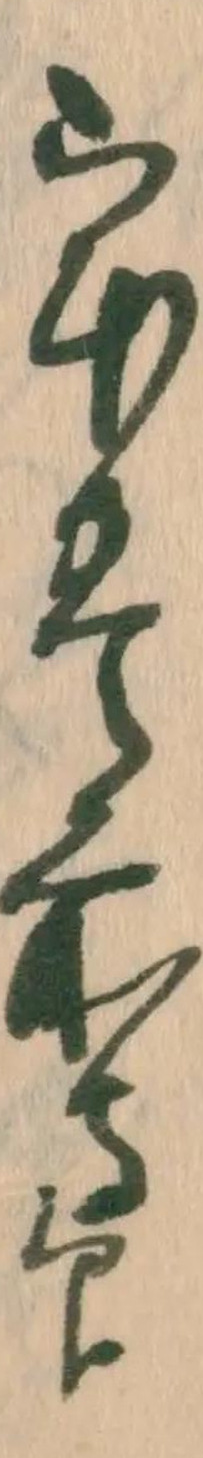山本豊前守印
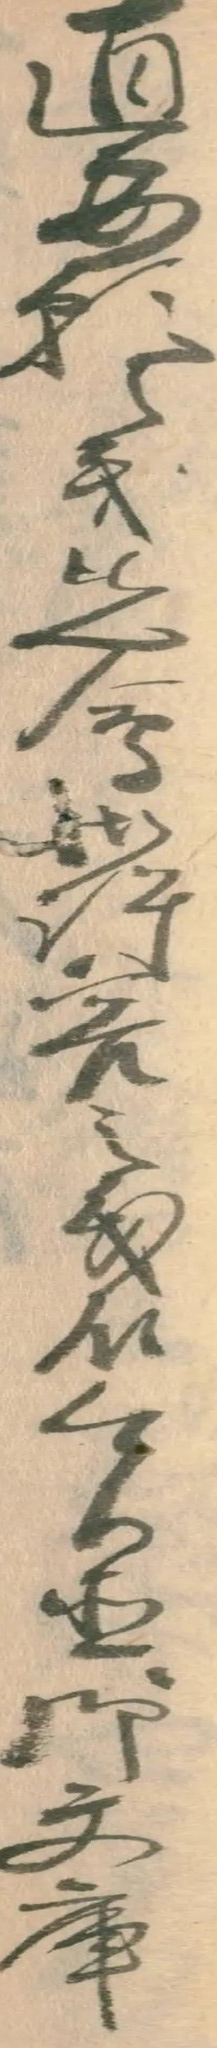直安願之義先会御許容之義故今日直ニ御文庫
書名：賀茂社記録. 第60冊
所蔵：国立国会図書館 National Diet Library, JAPAN
